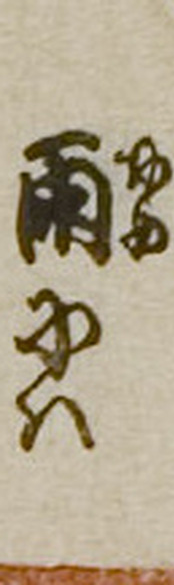雨には
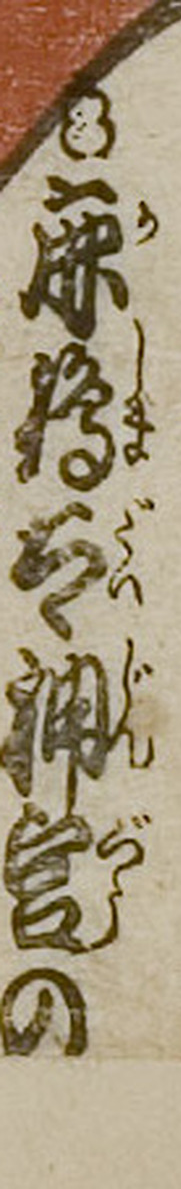鹿嶋太神宮の
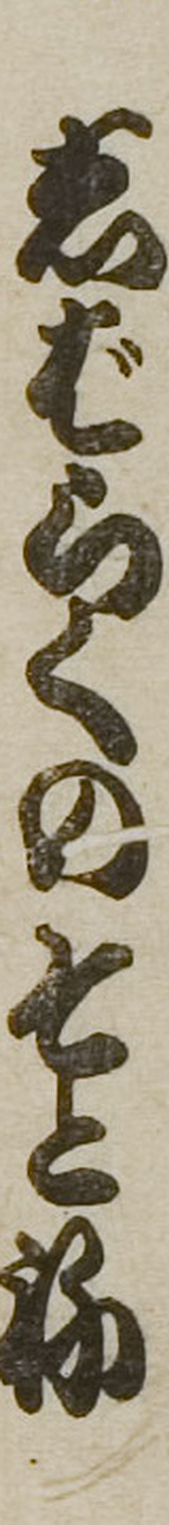しばらくのそとね
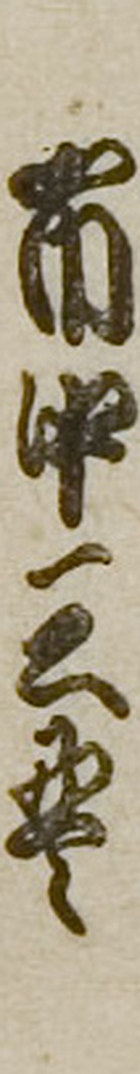市中三畳
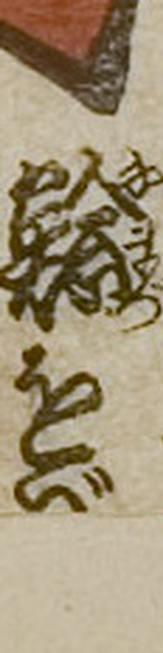鯰をば
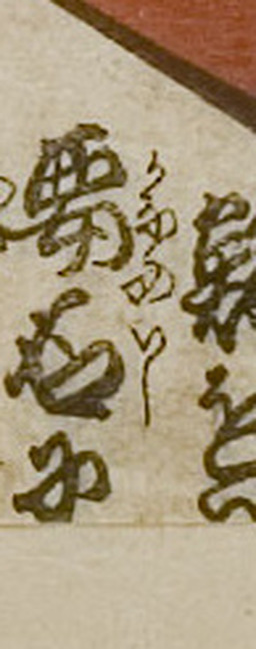要石に
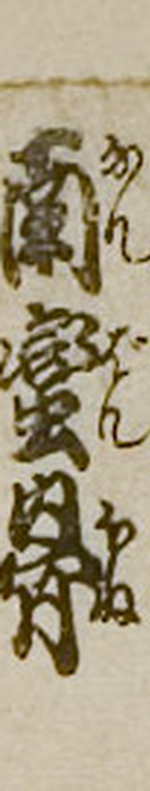南蛮骨
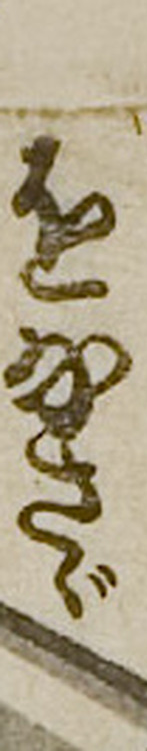をなさゞ
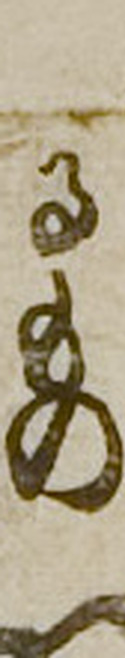るもの
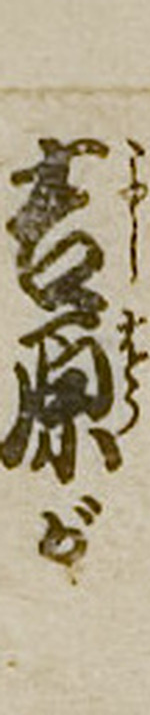吉原が
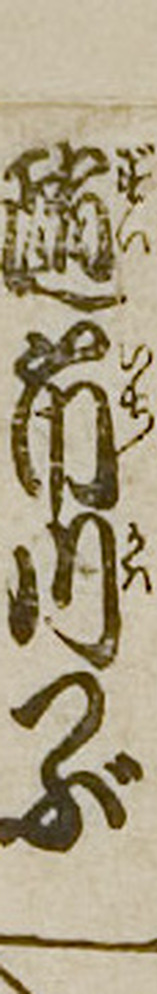随市川つぶ
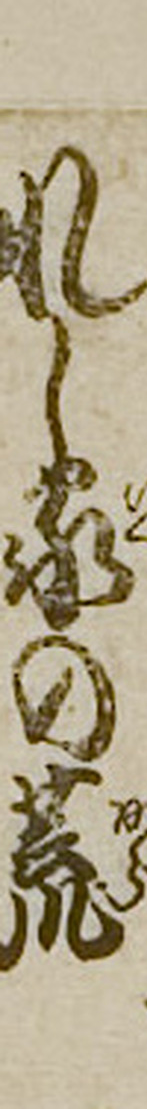れし家の荒
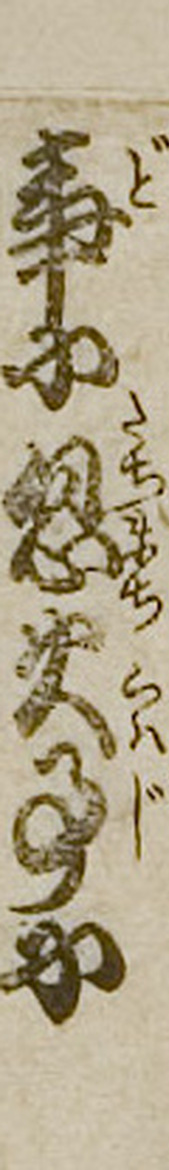事に忽火事に
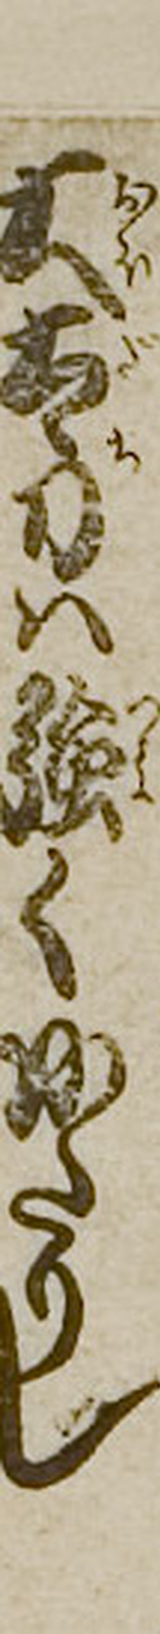大太刀は強くあたりし
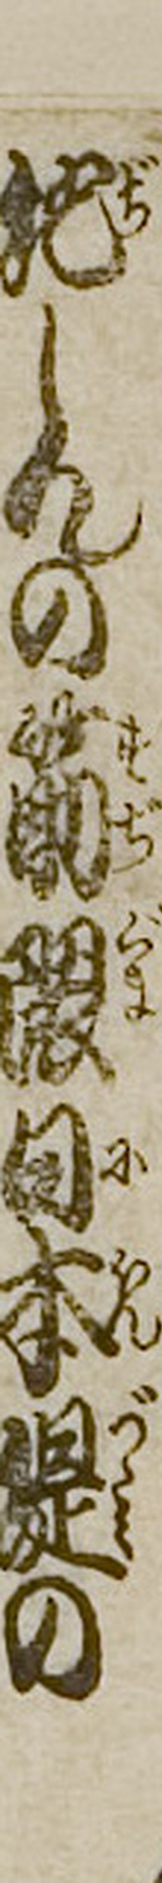地しんの筋隈日本堤の
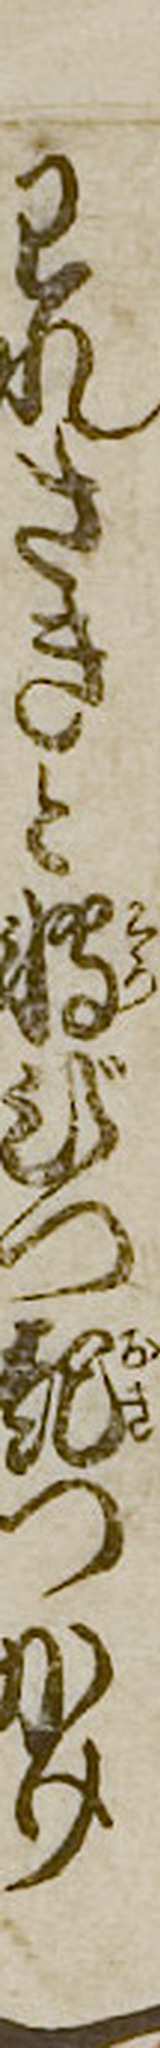われさきと転びつ起つかけ
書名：しばらくのそとね
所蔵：東京大学総合図書館 General Library in the University of Tokyo, JAPAN
